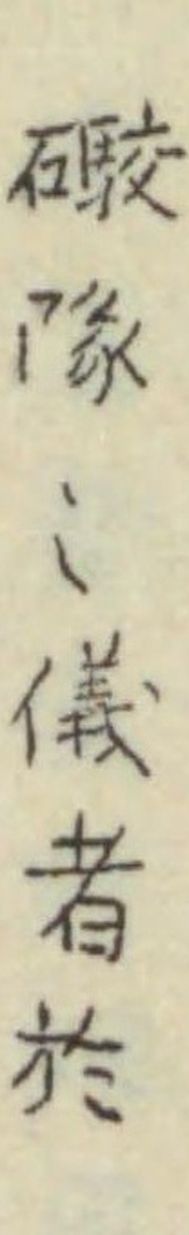礟隊之儀者於
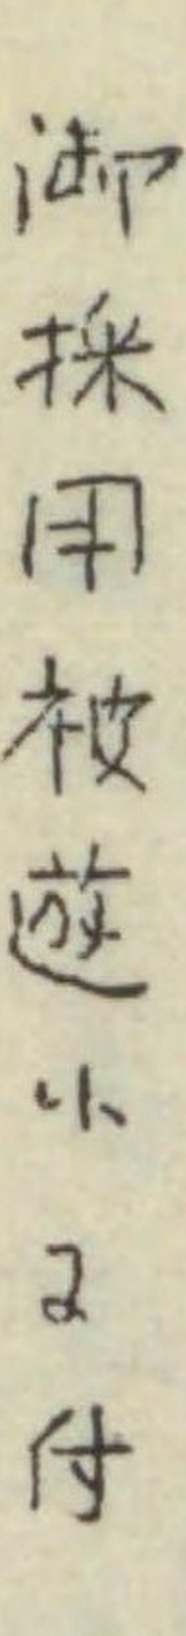御採用被遊び候に付
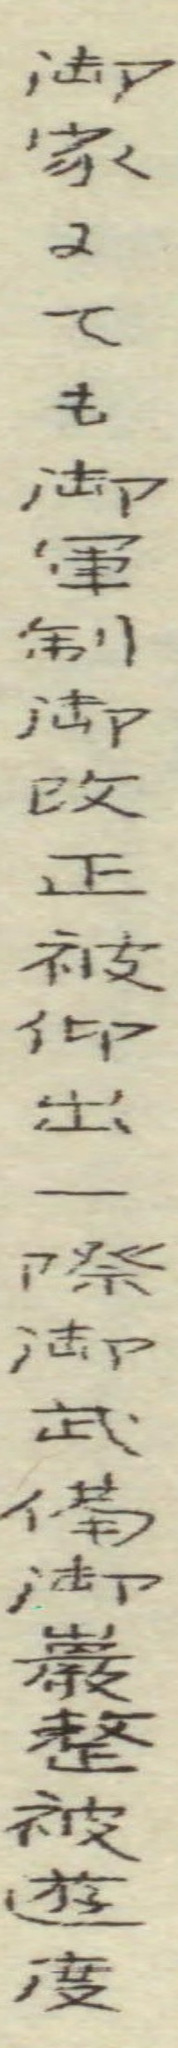御家にても御軍制御改正被仰出一際御武備御厳整被遊
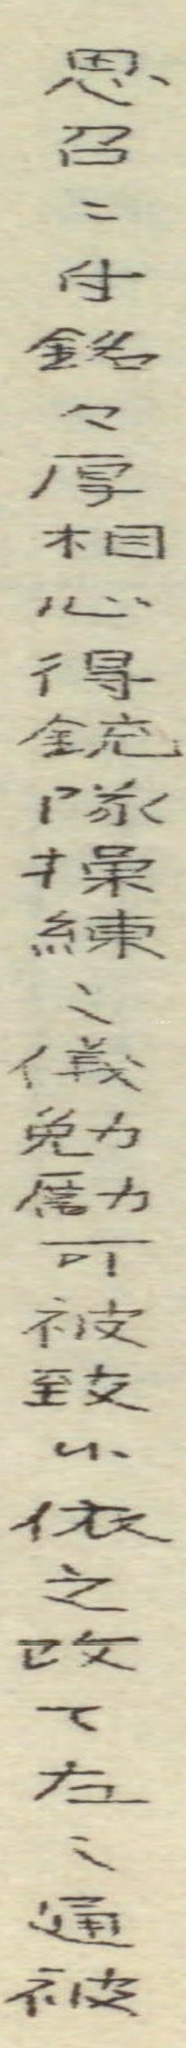思召二付銘々厚相心得銃隊操練之儀勉励可被致候依之改て左之通被
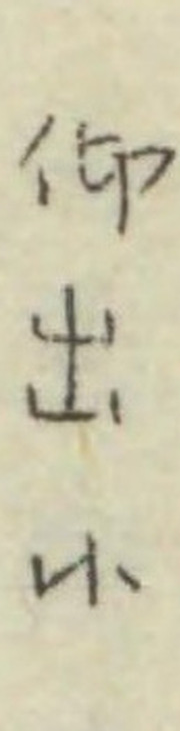仰出候
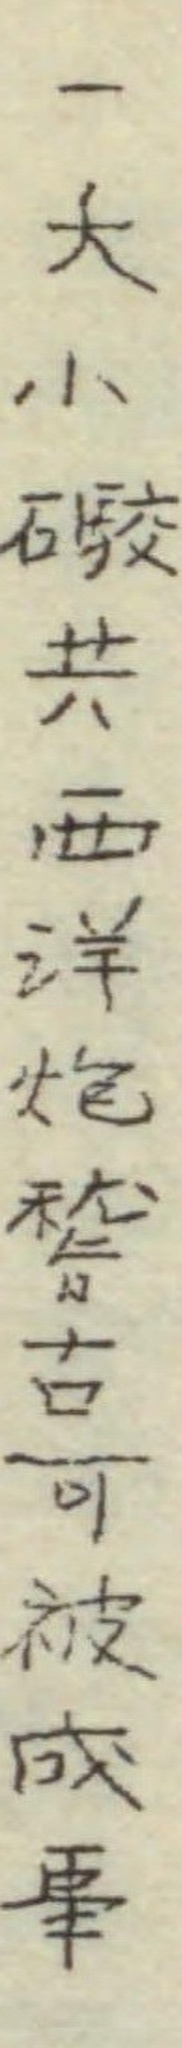一大小礟隊共西洋炮稽古可致成事
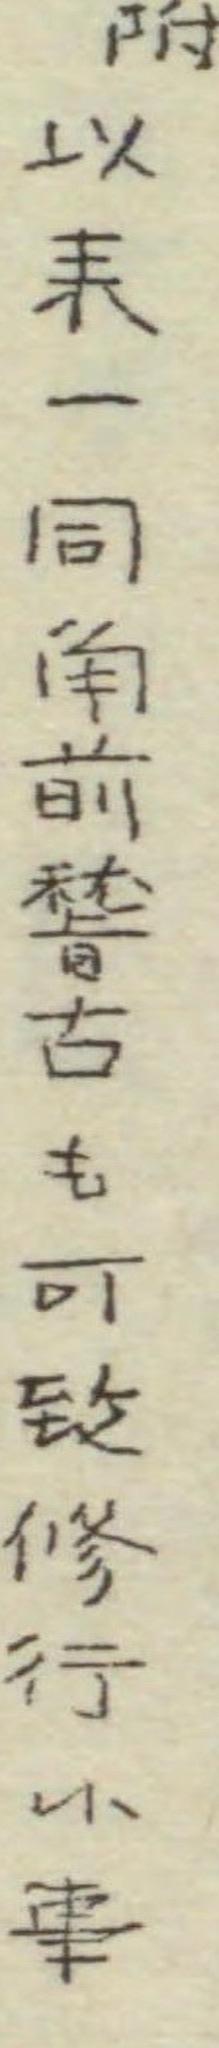附以来一同角前稽古も可致修行候事
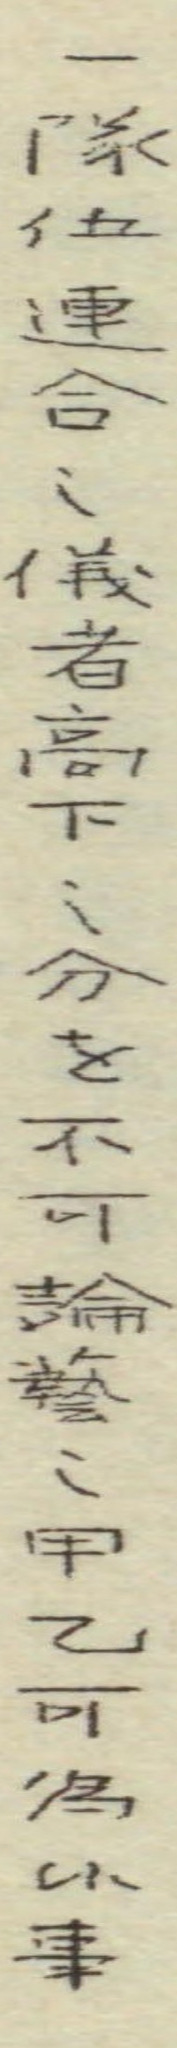一隊吾連合之儀者高下之分を不可論芸之甲乙可為候事
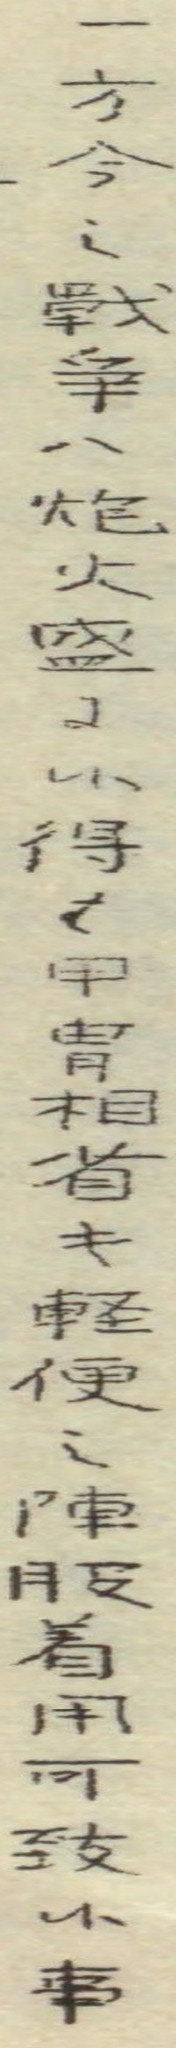一方今之戦争ハ炮火盛に候得は甲冑相省キ軽便之陣服着用可致候事
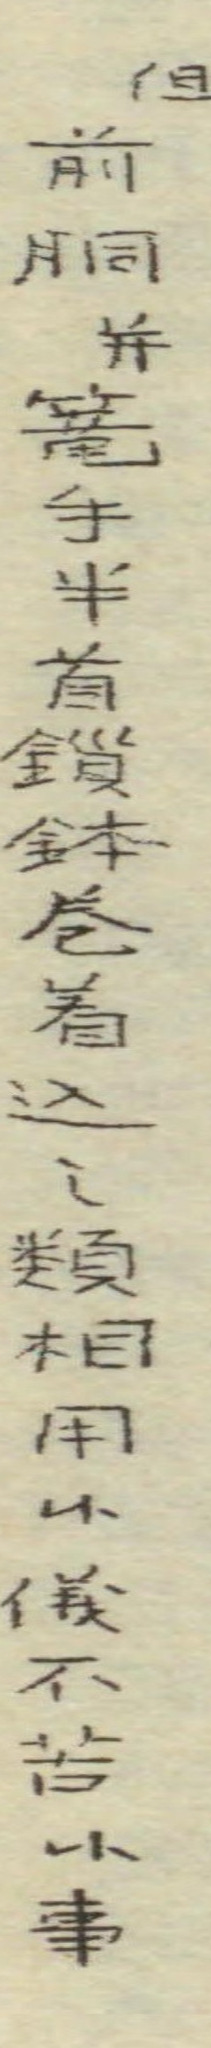但前胴并篭手半首鎖鉢巻着込之類相用候義不苦候事
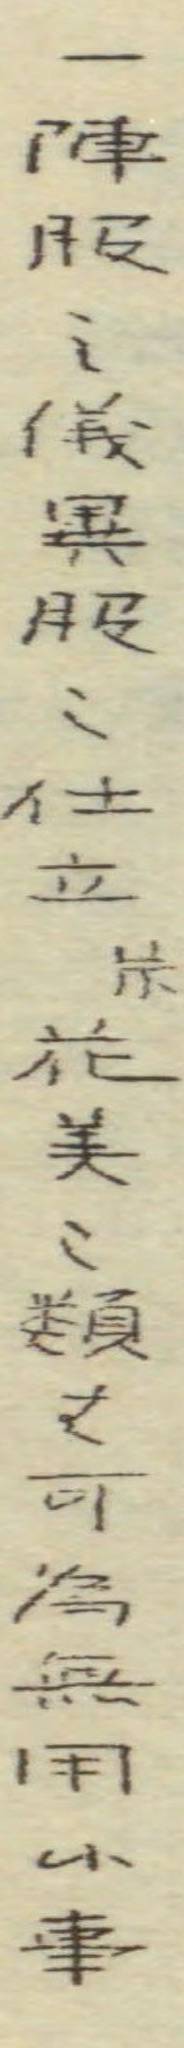一陣服之儀異服之仕立并花美々類は可為無用候事
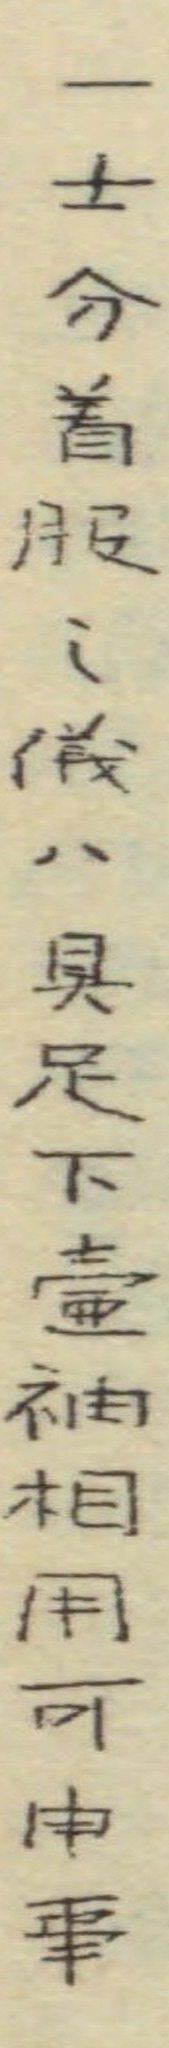一士分着服之儀ハ具足下臺袖相用可申事

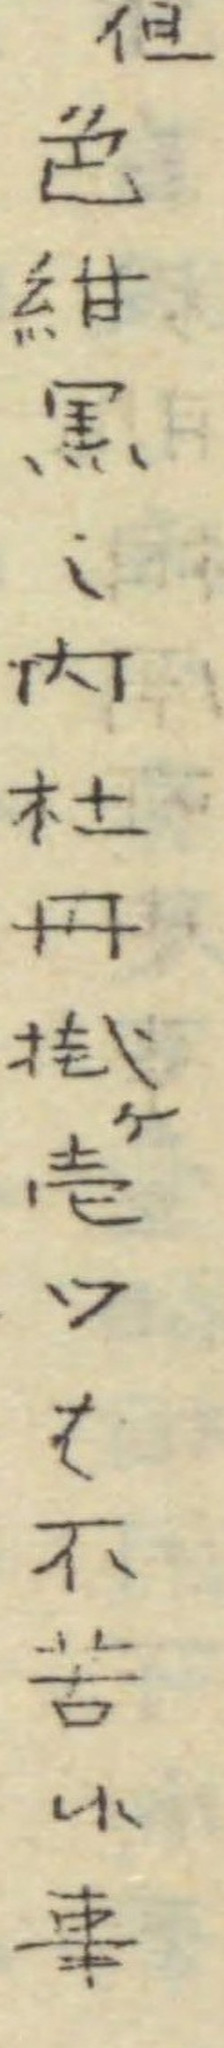但色紺黒之内牡丹掛ヶ壱ッは不苦候事
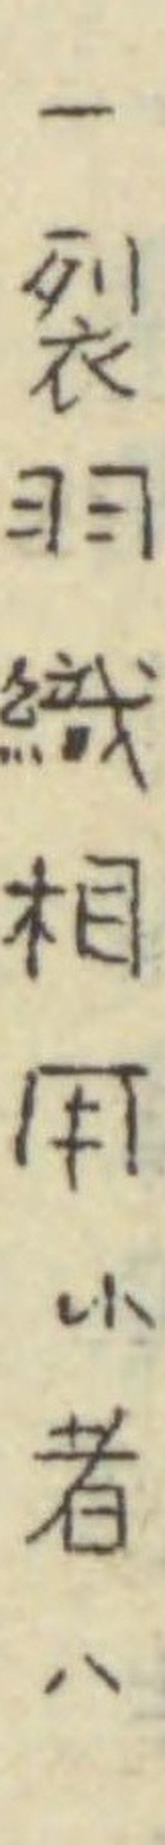一裂羽織相用候者ハ
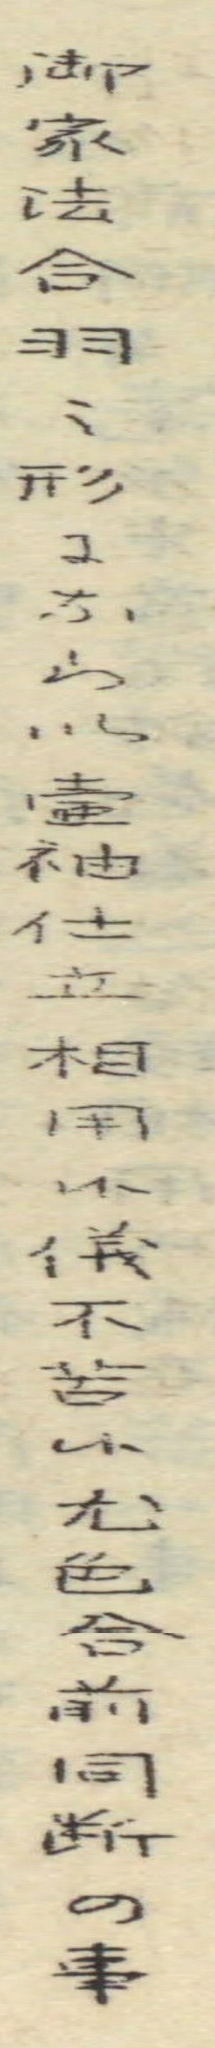御家法合羽之形にならい壼袖仕立相用候義不苦候尤色合前同断之事
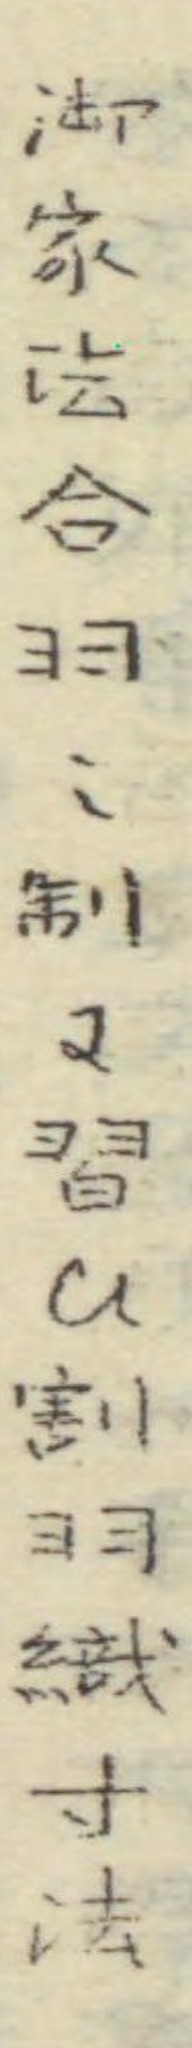御家法合羽之制に習ひ割羽織寸法
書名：三河吉田藩動員史料
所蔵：国立国会図書館 National Diet Library, JAPAN
